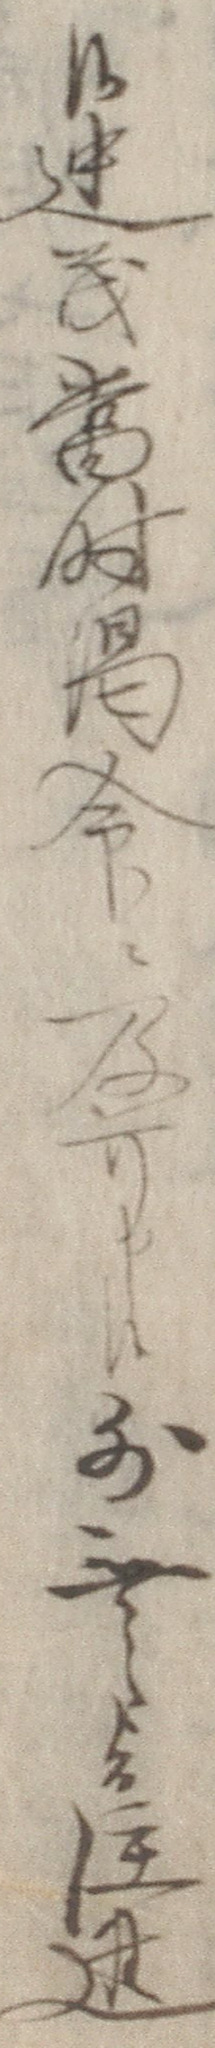候迚も当時渇命ニ及可申候外無之旨注進
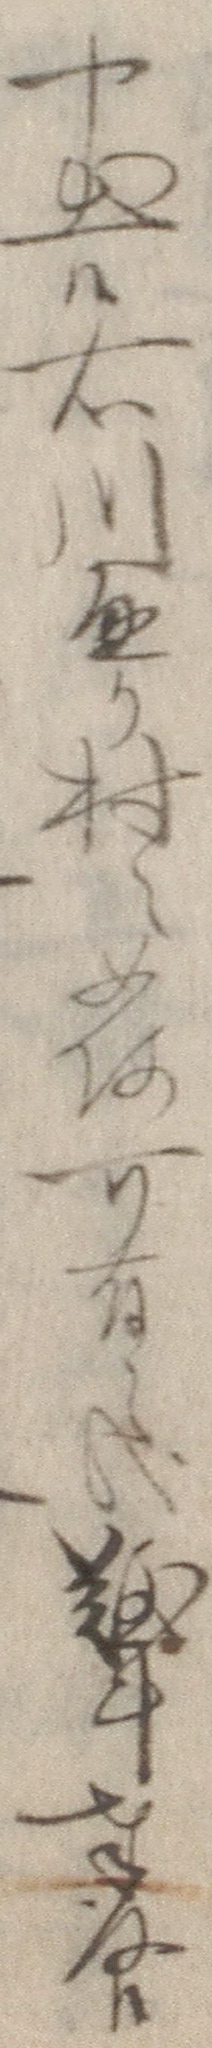申出候右川通り村々如何可有之哉難斗奉存候
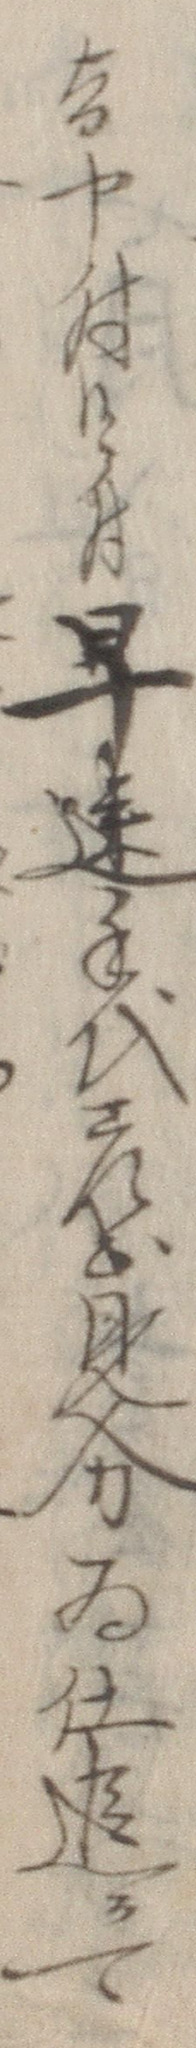旨申付候ニ付早速手代差出見分為仕追而可
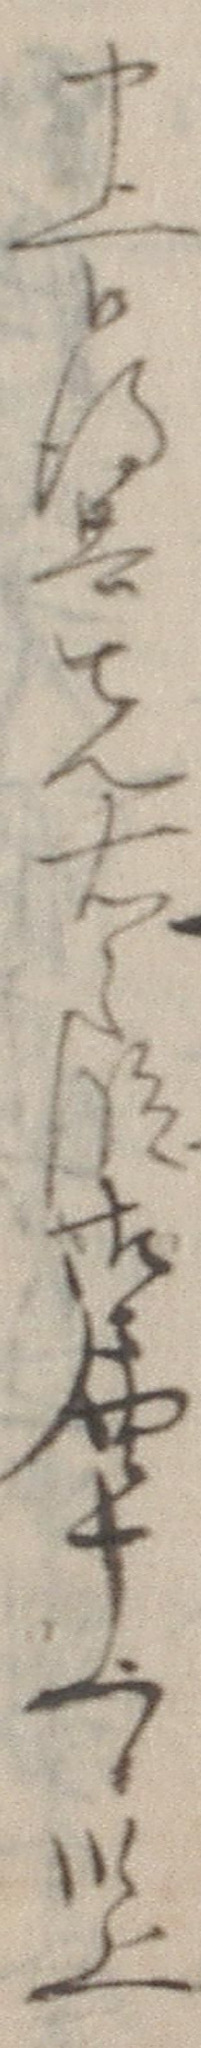申上候得共先右之段御届申上候以上
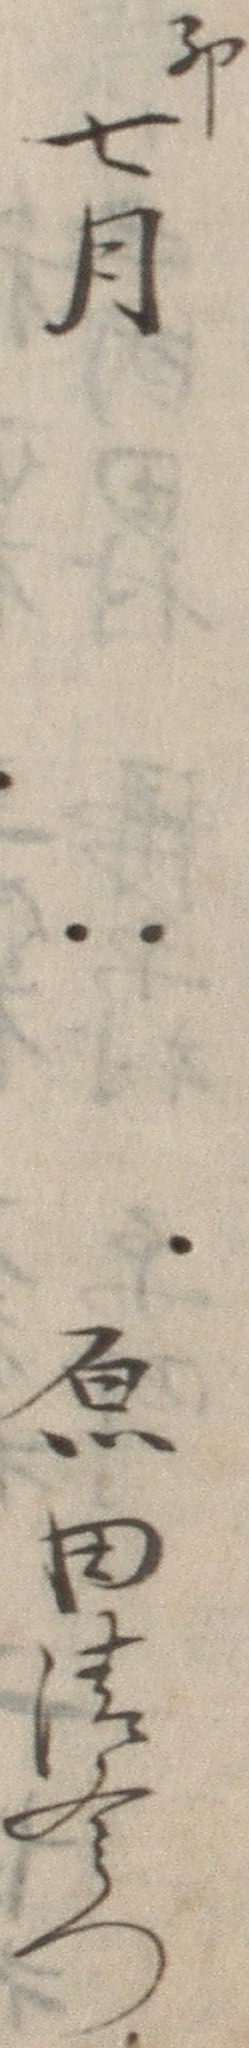七月原田清右衛門
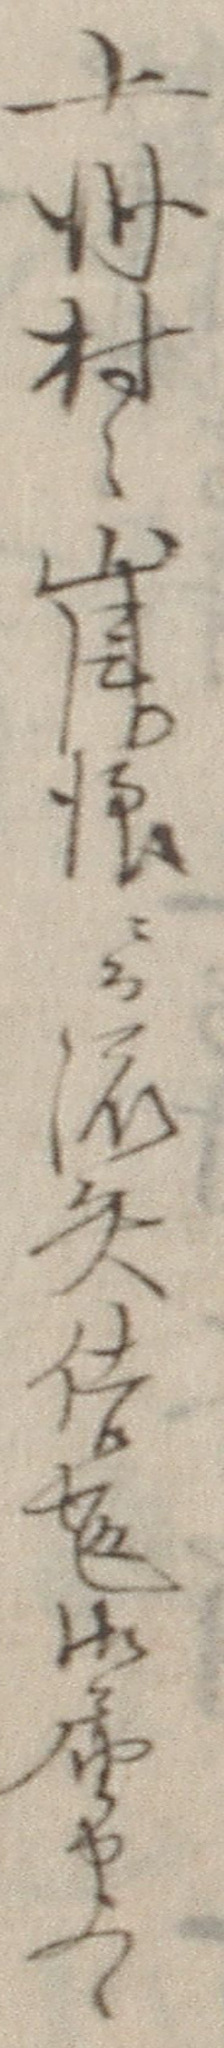上州村々山津浪ニ而流失仕候趣御届申上候
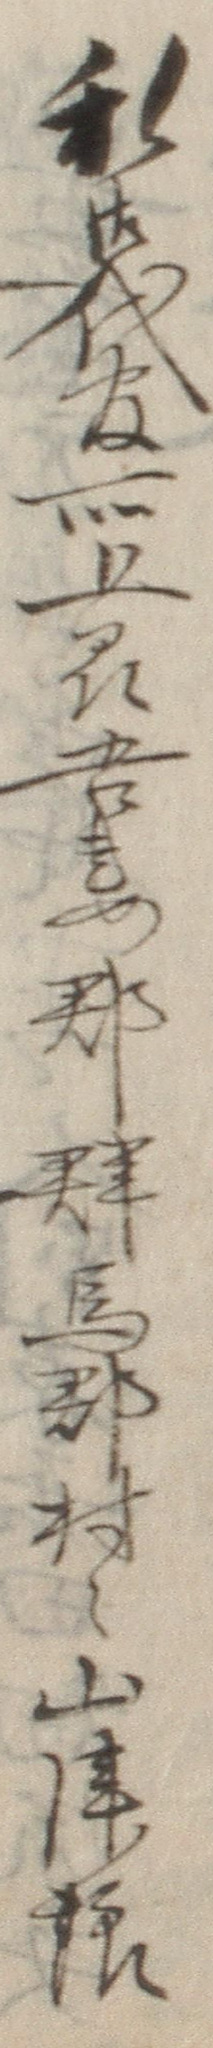私御代官所上州吾妻郡群馬郡村々山津浪
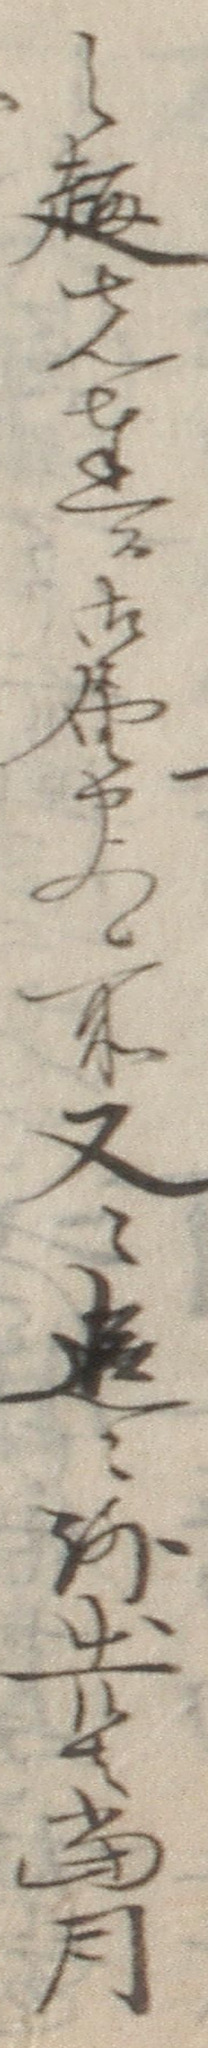之趣先達而御届申上候所又々追々訴出候は当月
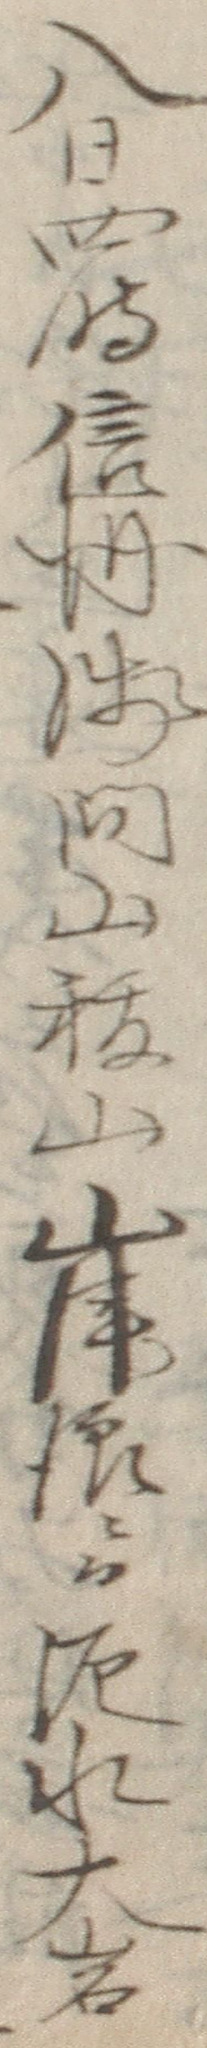八日四時信州浅間山抜山山津浪ニ而泥水大岩
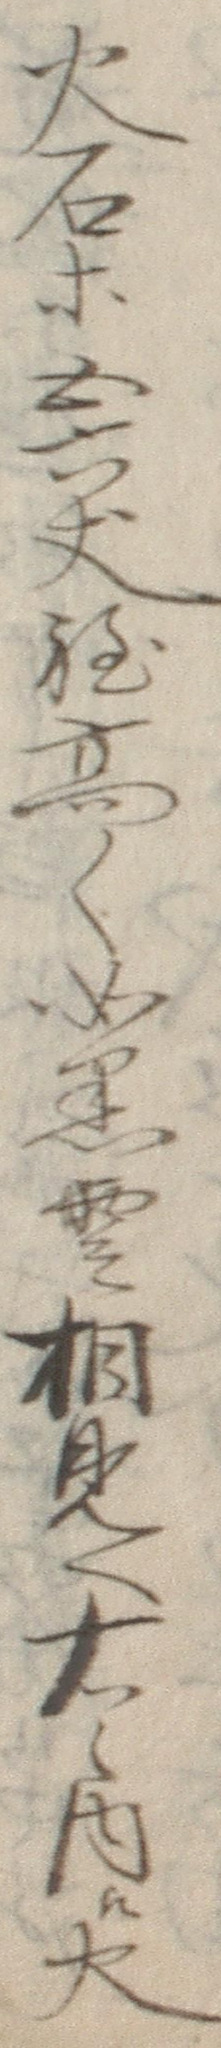火石等五六丈程高く如黒雲相見へ右之内え火
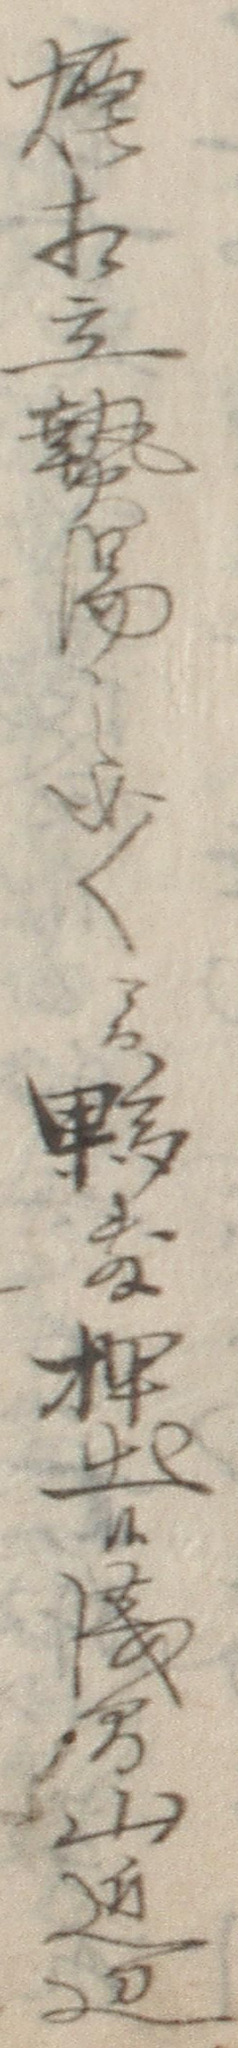煙相立熱湯之如くニ而夥敷押出候浅間山近辺
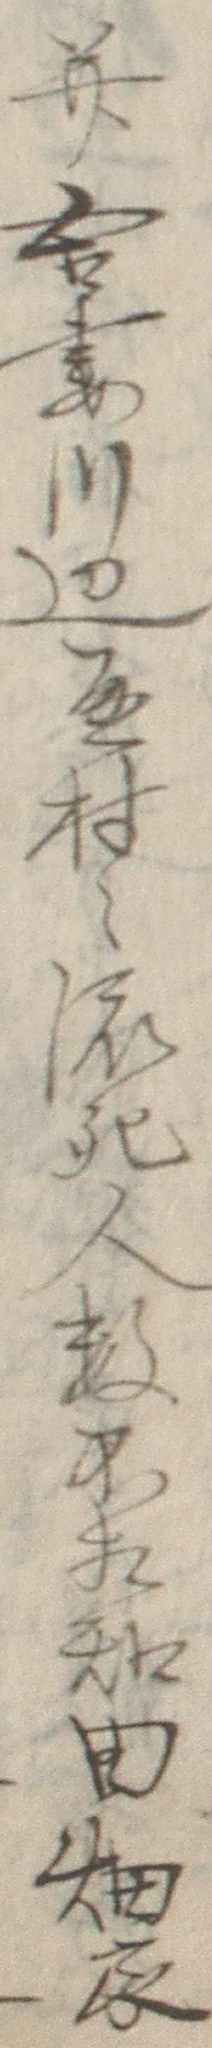并吾妻川辺通村々流死人数不相知田畑家
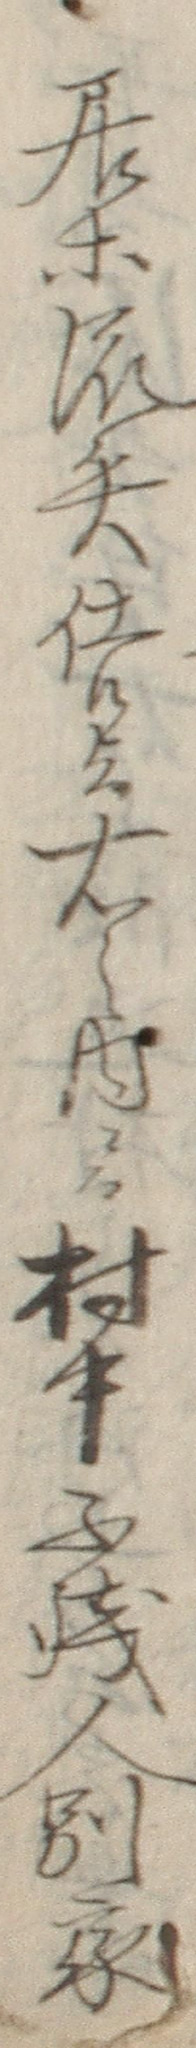居等流失仕候旨右之内ニ而村中不残人別家

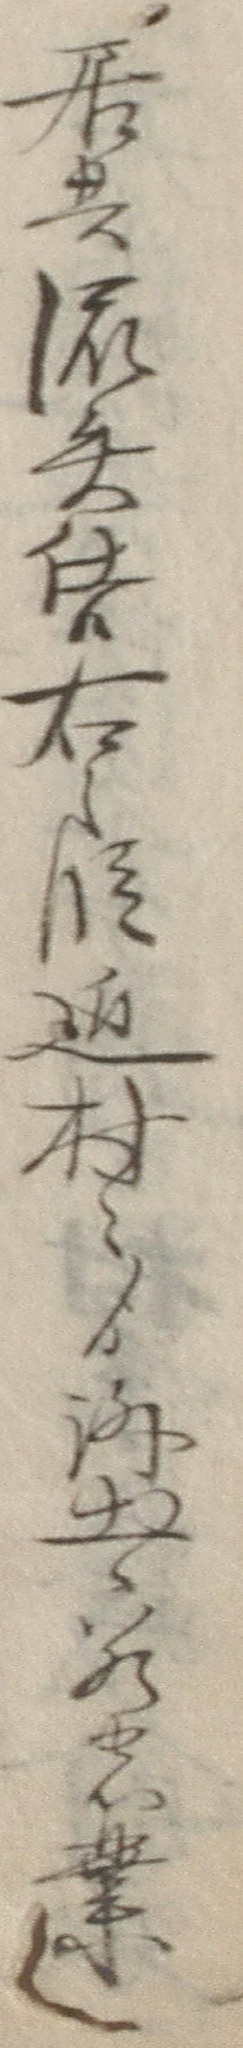居共流失仕候右之段近村々ゟ訴出候若農業
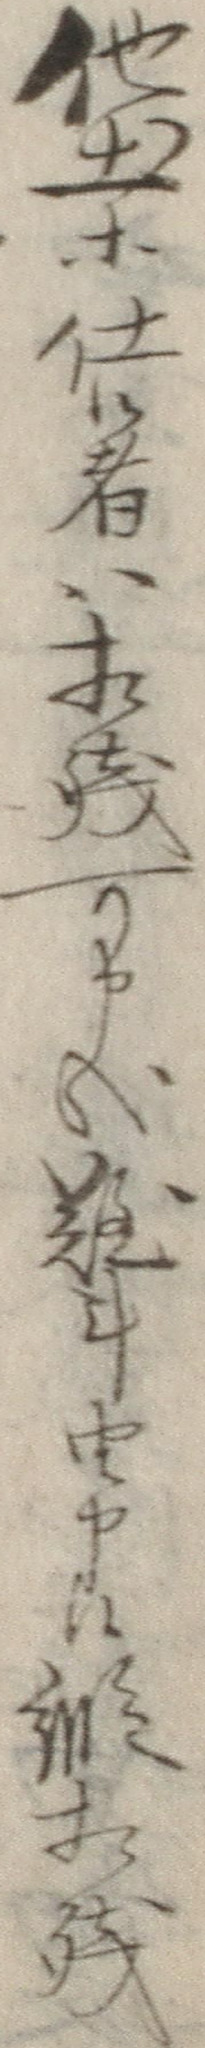他出等仕候者は相残可申哉難斗由申候縦相残
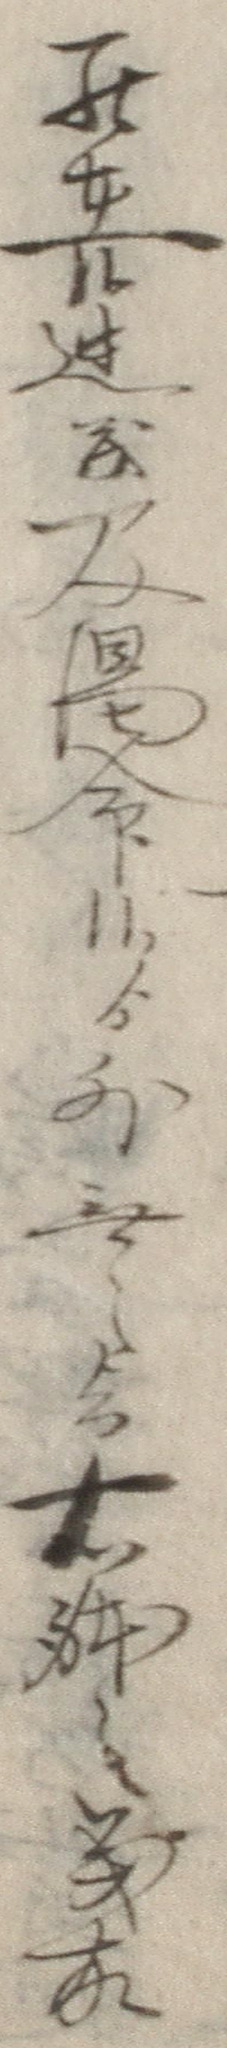罷在候迚も及渇命候ゟ外無之旨右躰之儀故
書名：[諸国災害記録]
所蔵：東京大学地震研究所図書室 Earthquake Research Institute Library, The University of Tokyo, JAPAN
